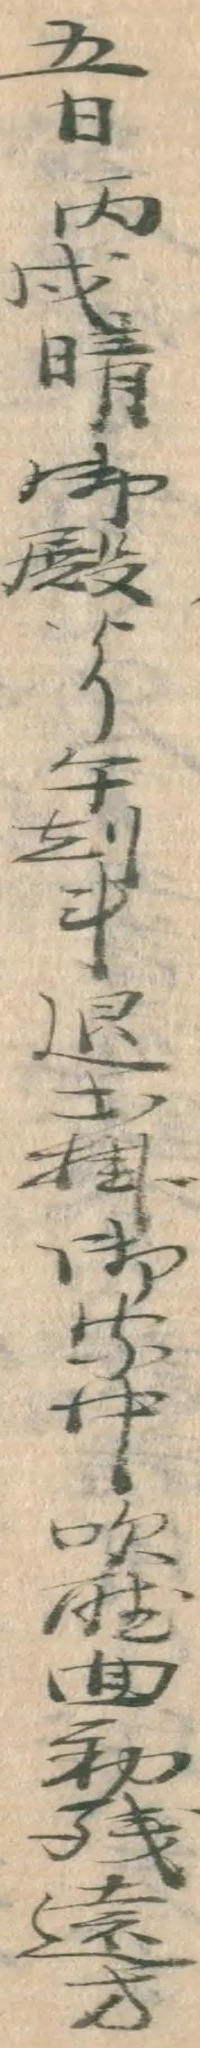五日丙戌晴御殿より午刻斗退出掛御家中へ吹聴回勤残遠方
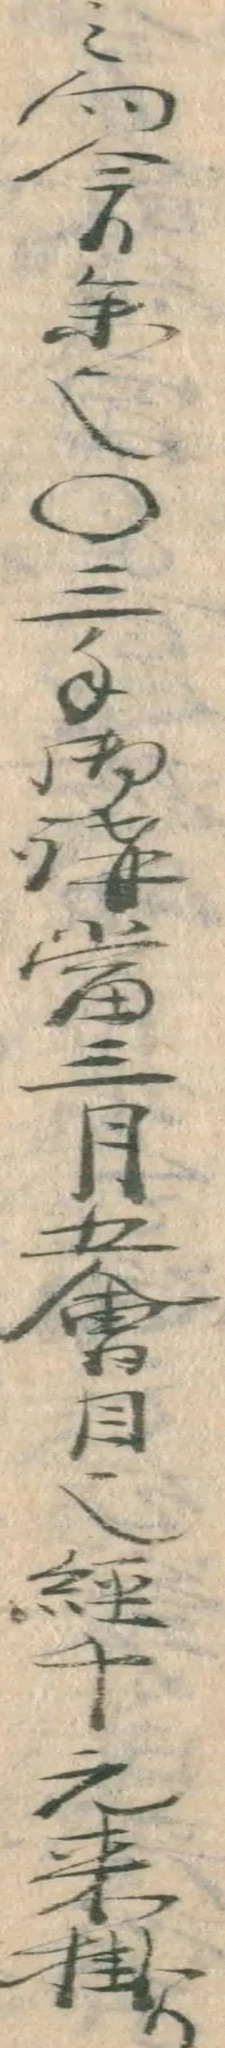之向今参也○三手御講當三月五會目也経千元来掛リ
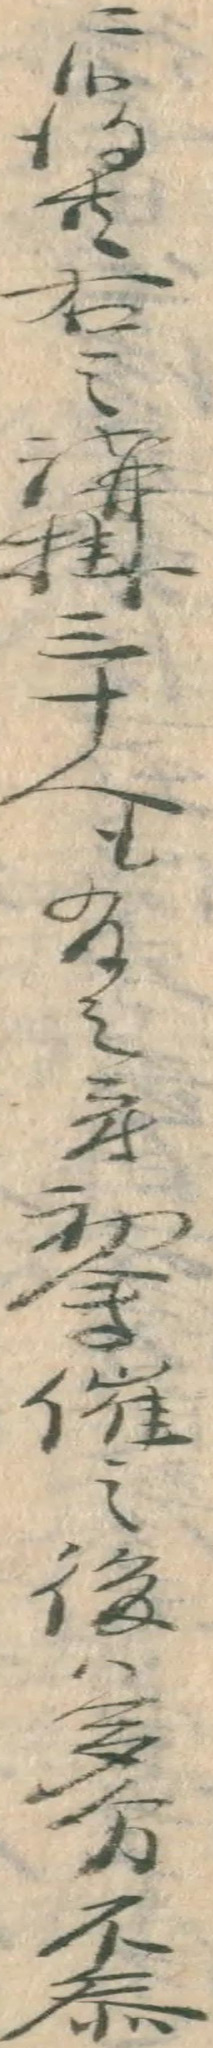ニ候得共右之講掛三十人も有之ニ付初會催之後は多分不参
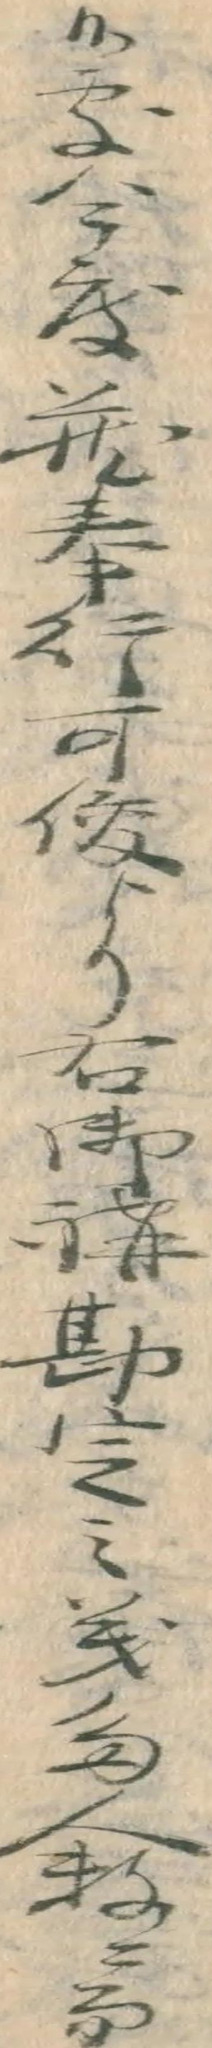候處今度蔵奉行可俊より右御構勘定之義多人数ニ而
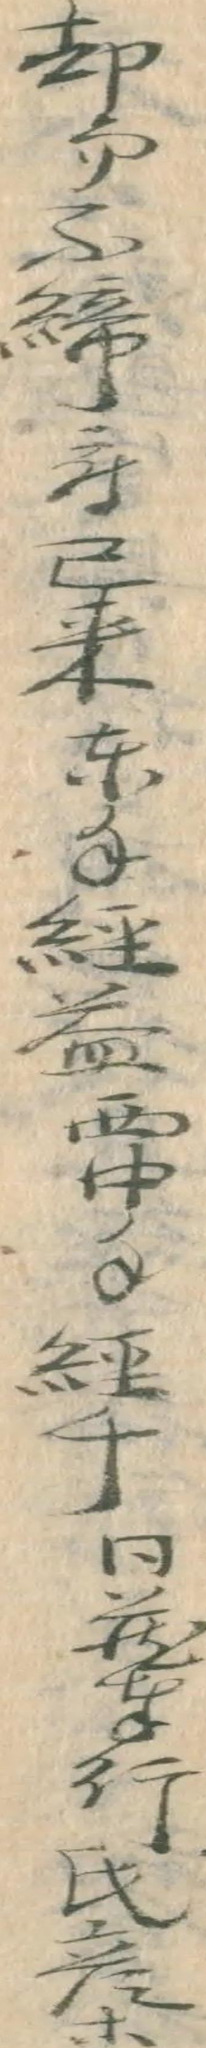却而不締ニ付已来東手経益西中手経千同蔵奉行氏彦等

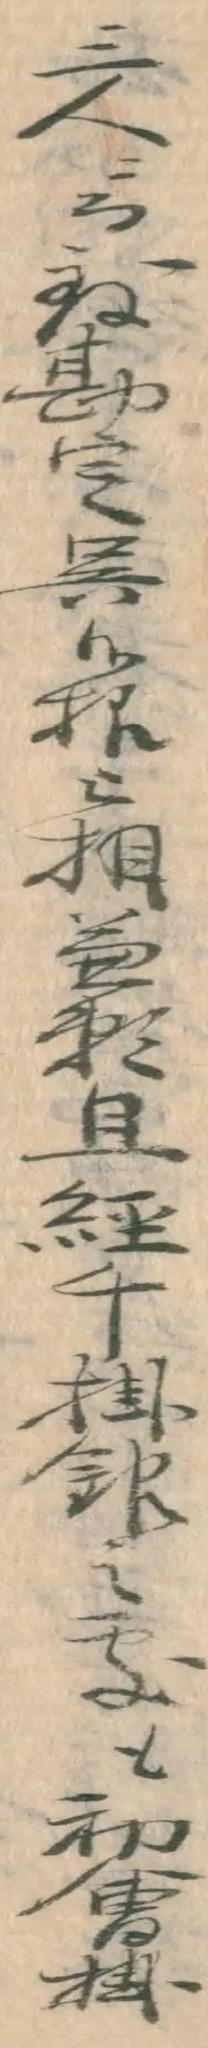三人ニ而致勘定呉候様被相兼頼且経千掛銀之處も初會掛
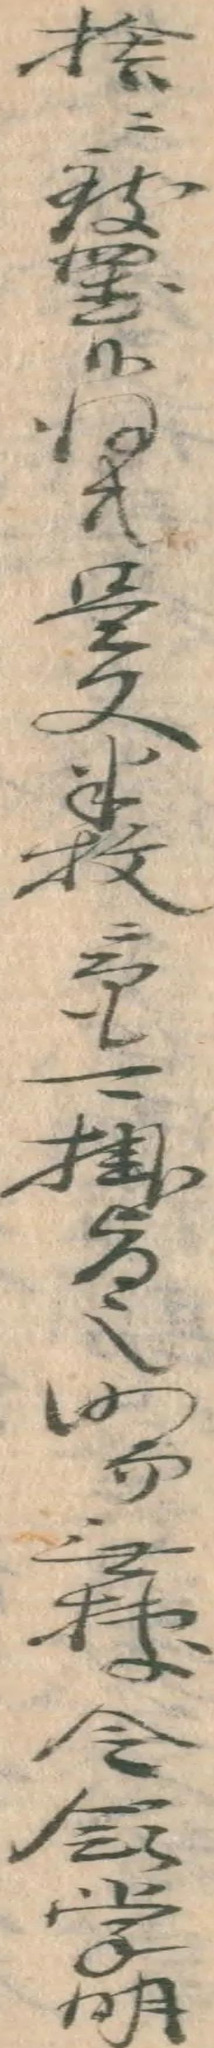捨ニ致置候得共是又半枚ニ而も可掛旨也仍而無拠令領掌明
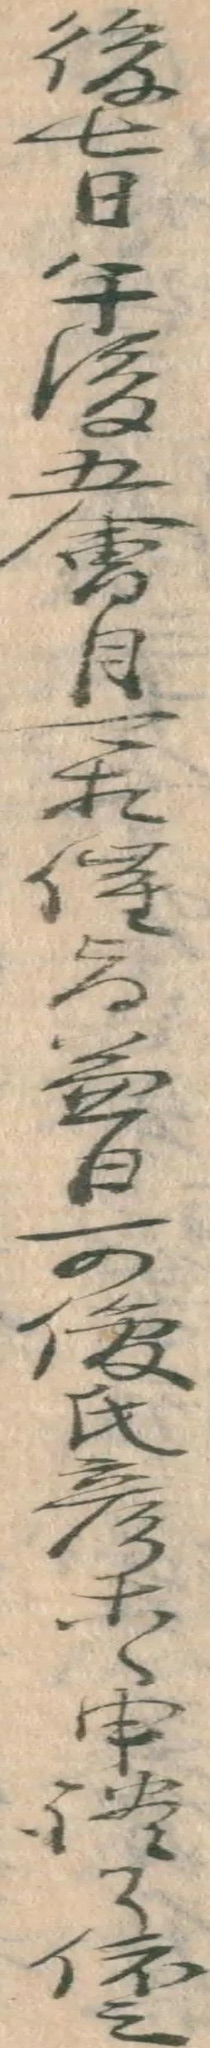後七日午後五會目可相催旨兼日可俊氏彦等へ申談了依之
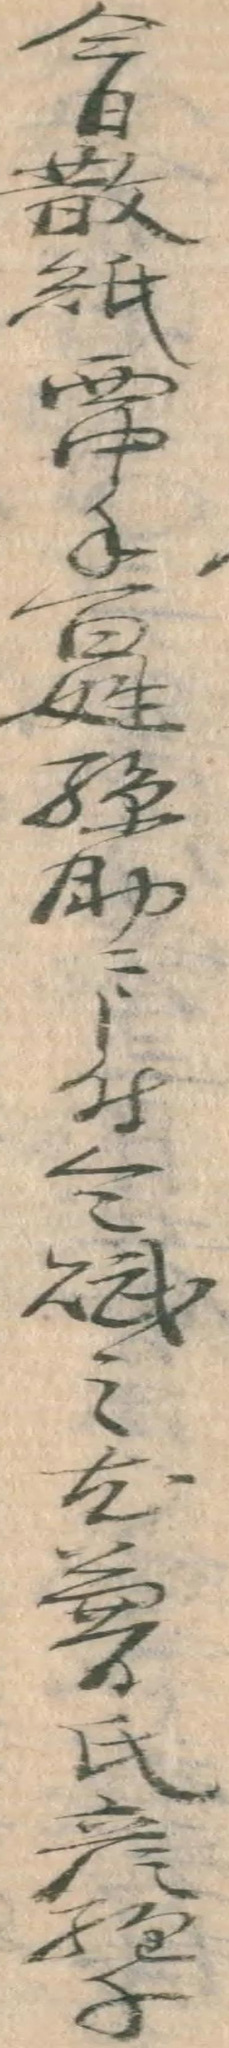今日散紙西中手百姓孫助ニ申付令賦之尤兼而氏彦経千
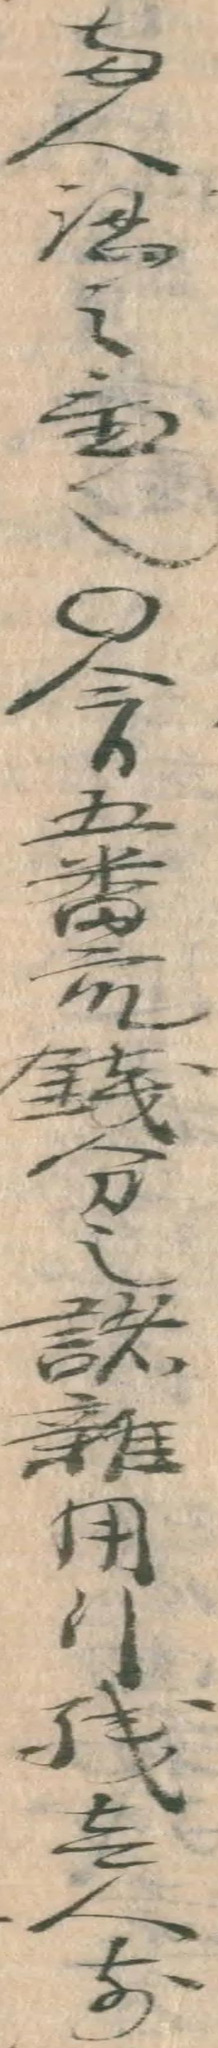両人認之置也○今日五番衆銭分之諸雑用引残壱人前
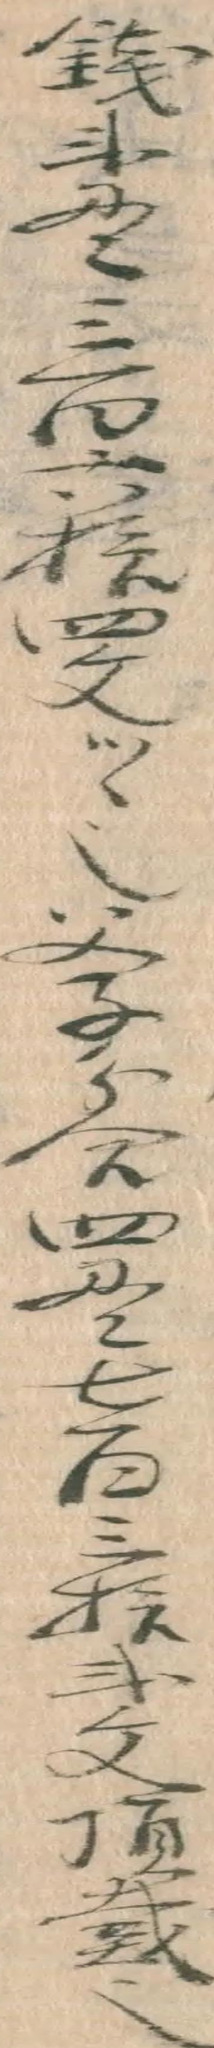銭弐貫三百六拾四文ツヽ也父子分合四貫七百三拾弐文頂戴也
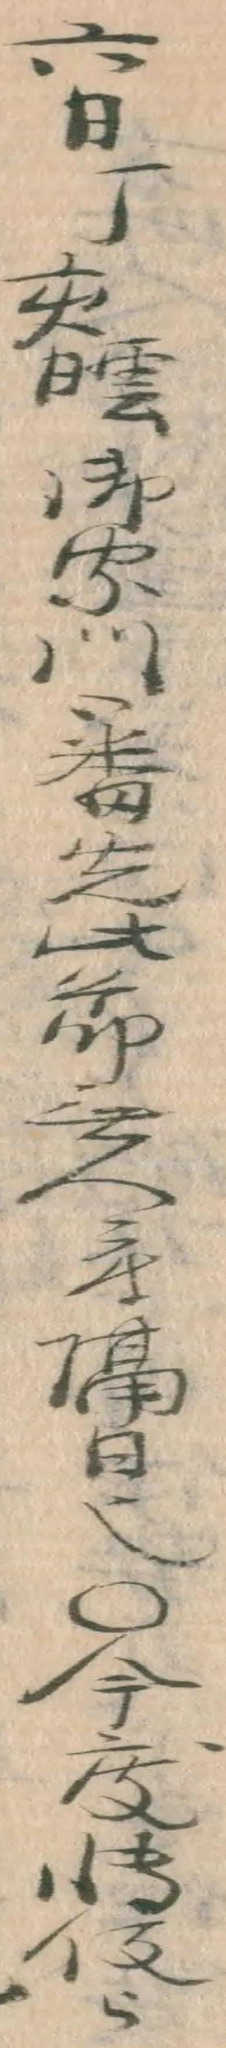六日丁亥曇御家門御番先此節無人ニ付隔日也○今度轉役被
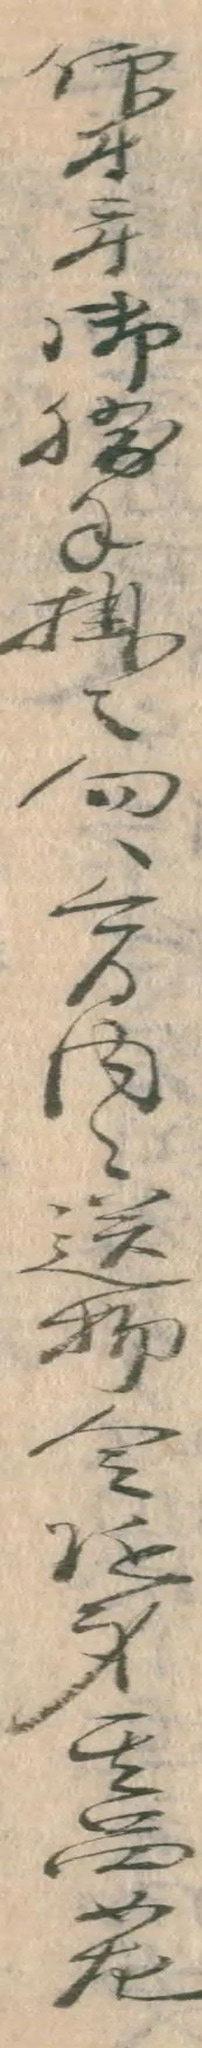仰付ニ付御勝手掛之向へ今日内々送物令随身其品如左
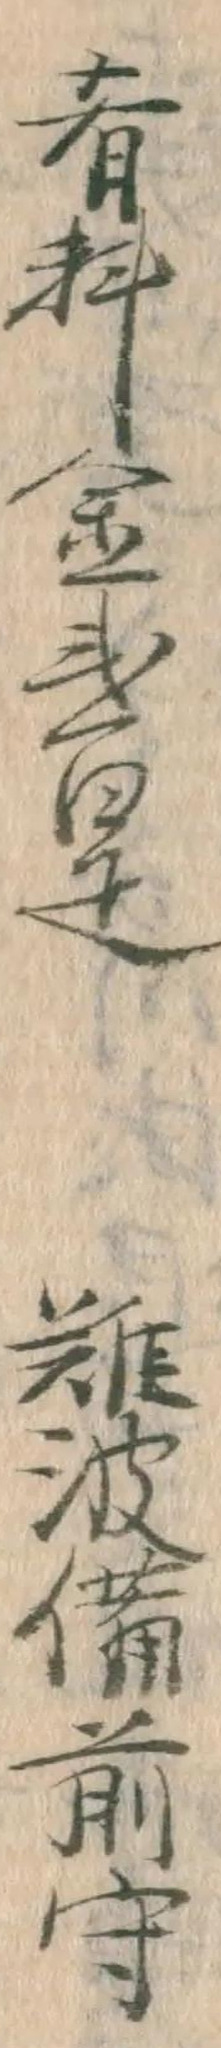肴科金弐百疋難波備前守
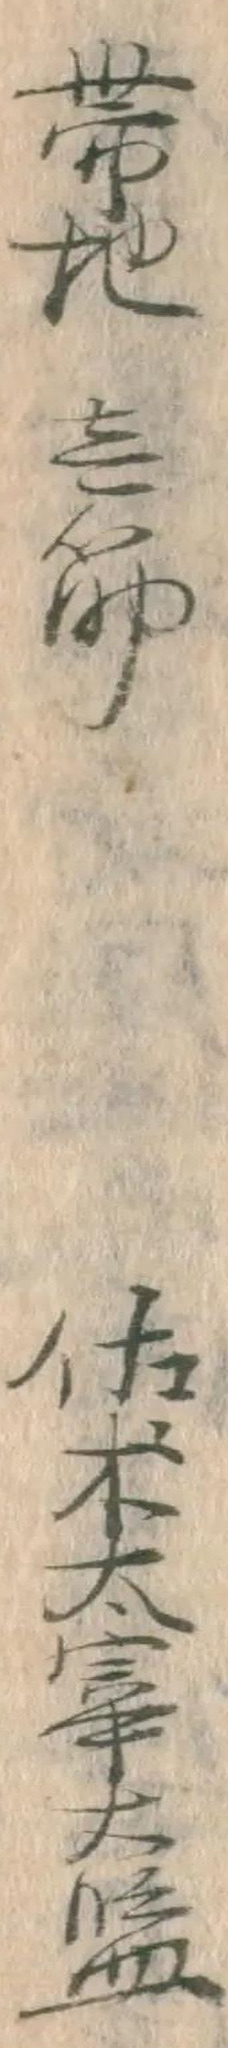帯地壱筋佐々木太宰大監
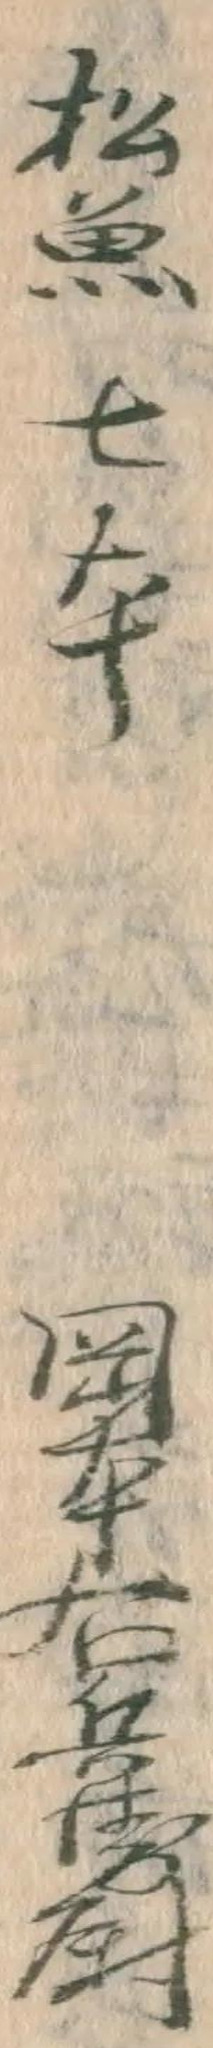松魚七本岡本右兵衛尉
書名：賀茂社記録. 第65冊
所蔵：国立国会図書館 National Diet Library, JAPAN
